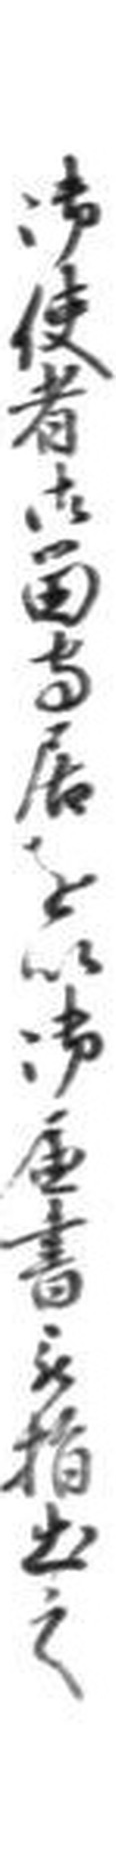御使者御留守居を以御届書被指出之

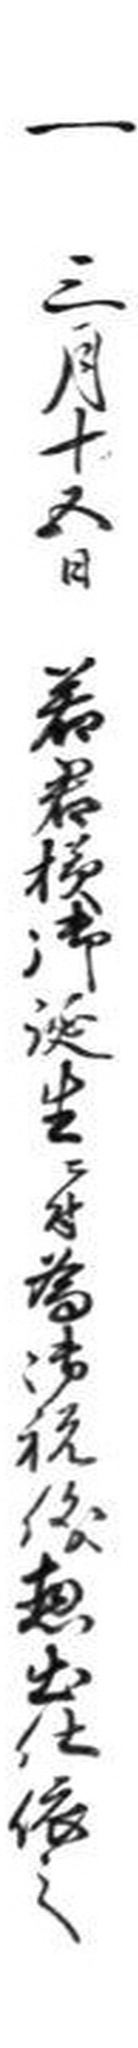一三月十五日若君様御誕生ニ付為御祝儀惣出仕依之
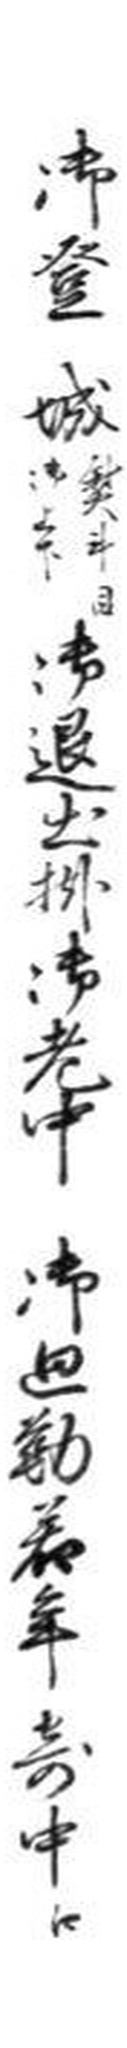御上下御退出掛御老中御廻勤若年寄中江
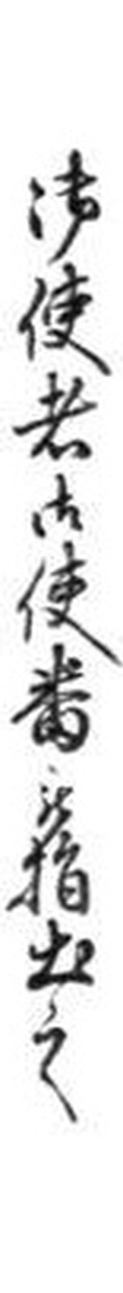御使者御使番被指出之
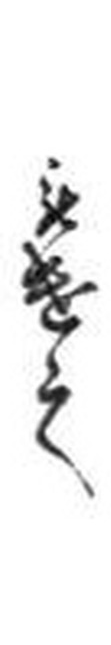被遣之
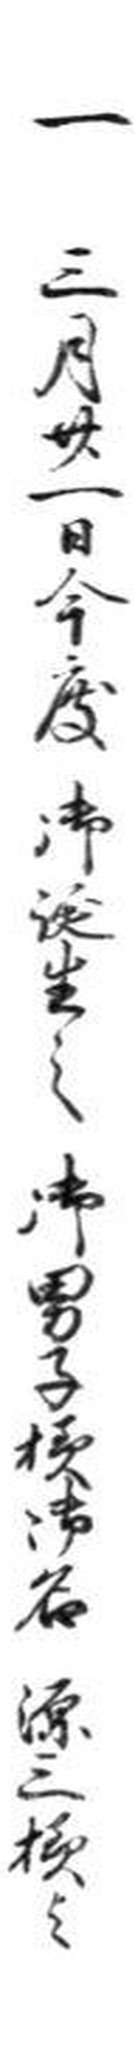一三月廿一日今度御誕生之御男子様御名源三様与
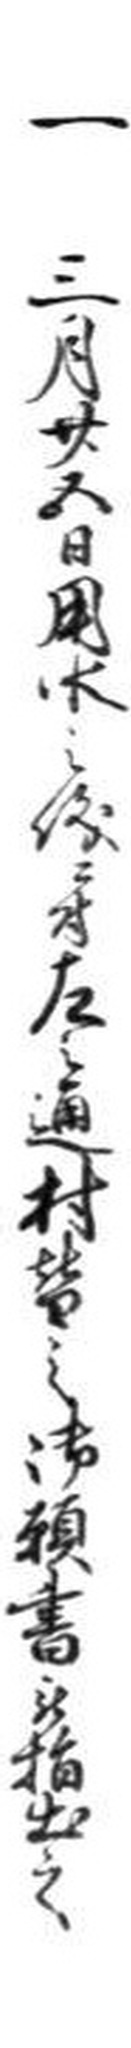一三月廿五日用水之儀ニ付左之通村替之御願書被指出之
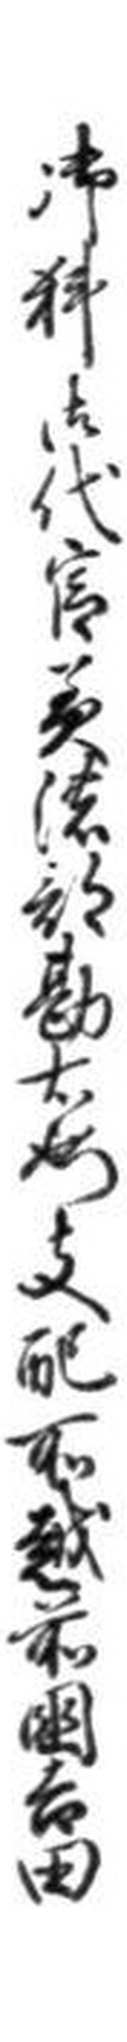御料御代官美濃部勘右衛門支配所越前国吉田
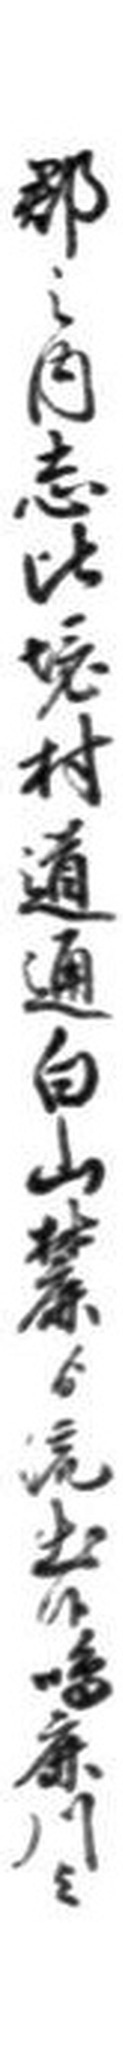郡之内志比境村道通白山麓ゟ流出候鳴鹿川与
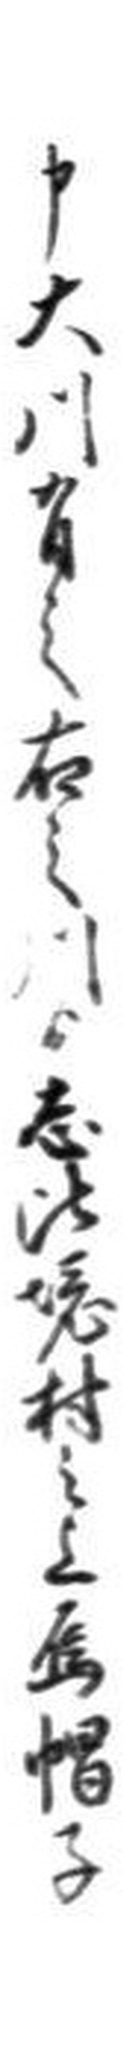申大川有之右之川ゟ志比境村之上烏帽子
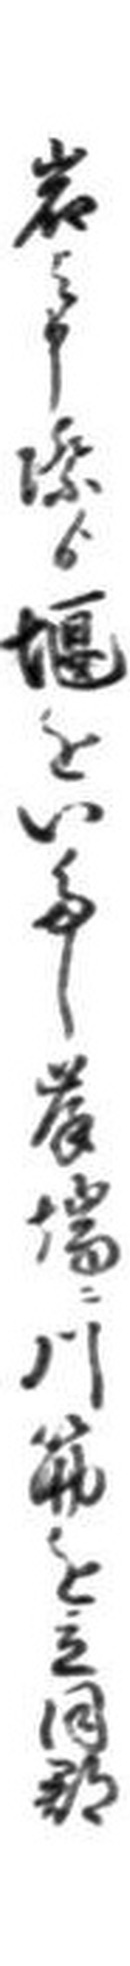岩与申際ゟ堰をいたし岸端ニ川筋を立同郡
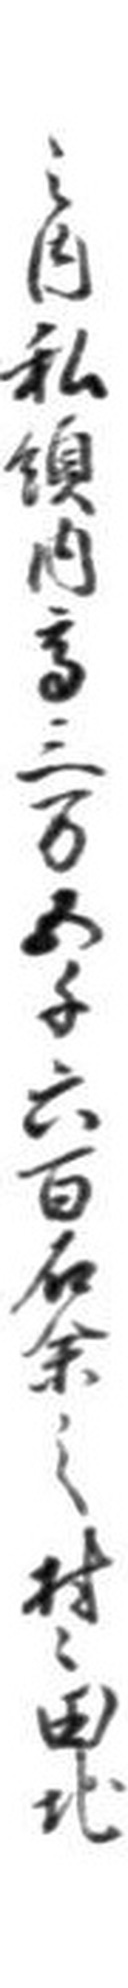之内私領内高三万五千六百石余之村々田地
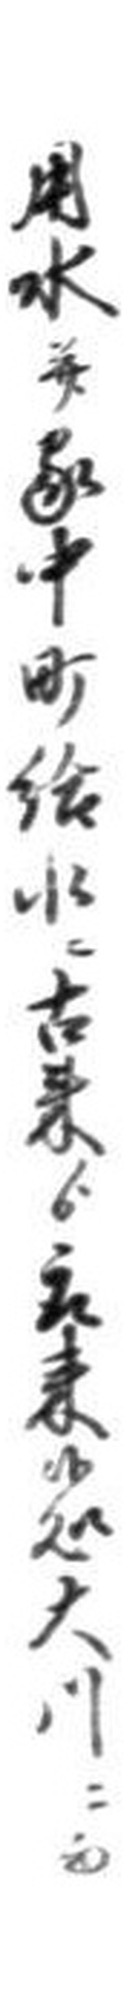用水并家中町給水ニ古来ゟ取来候処大川ニ而
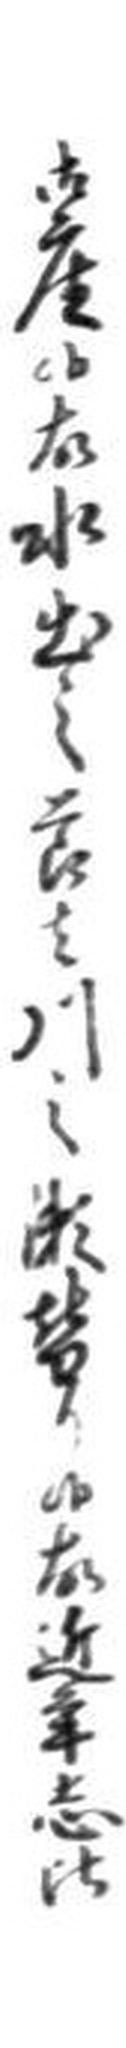御座候故水出之節者川之瀬替り候故近年志比
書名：家譜 三十三 吉邦公 享保四年
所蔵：福井県文書館 Fukui Prefectural Archives
